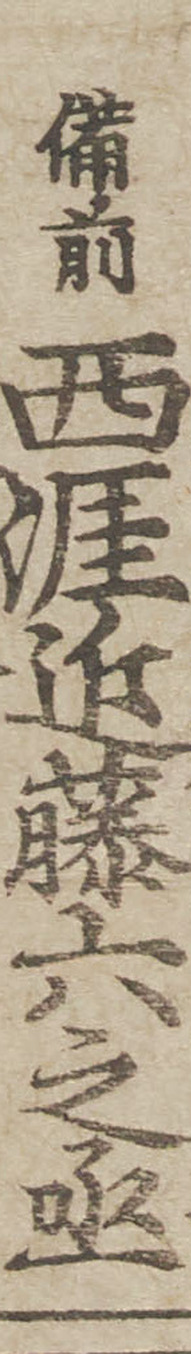同備前西涯近藤六之丞
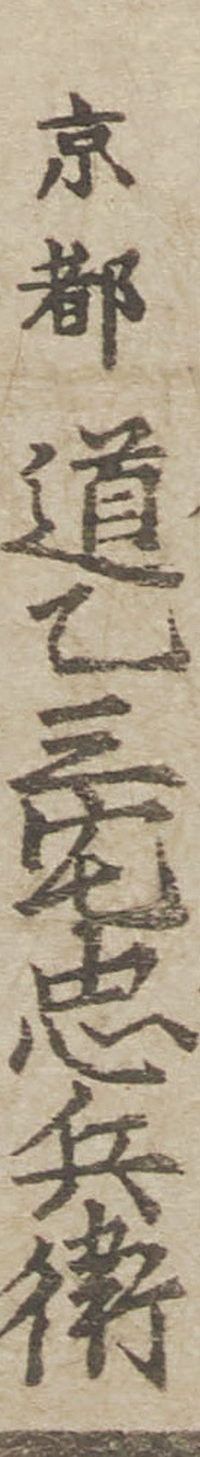同京都道乙三宅忠兵衛
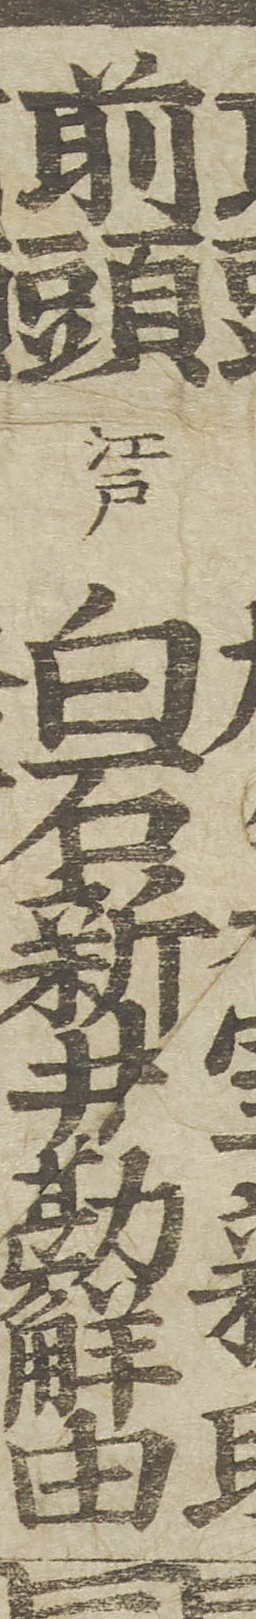前頭江戸白石新井勘解由
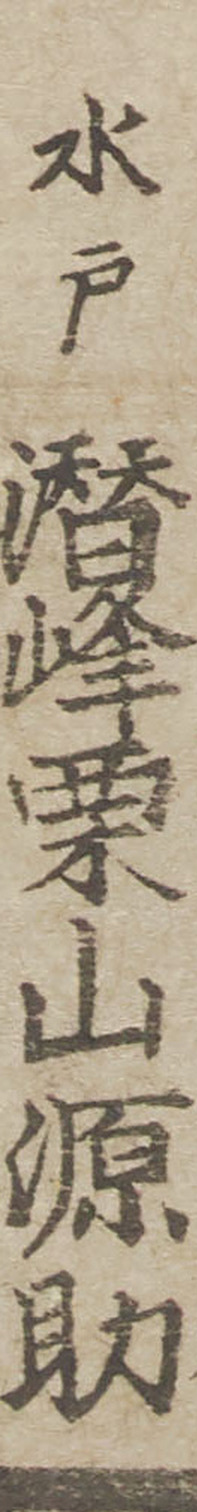同水戸潜峰栗山源助
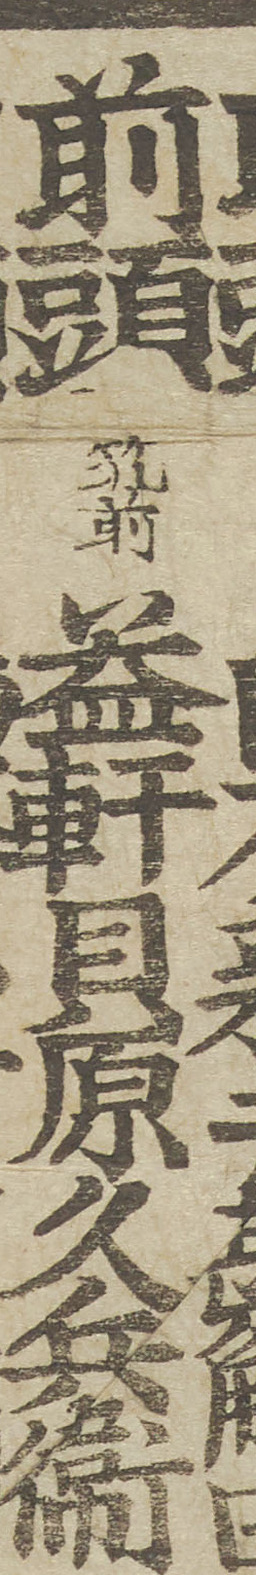前頭筑前益軒貝原久兵衛
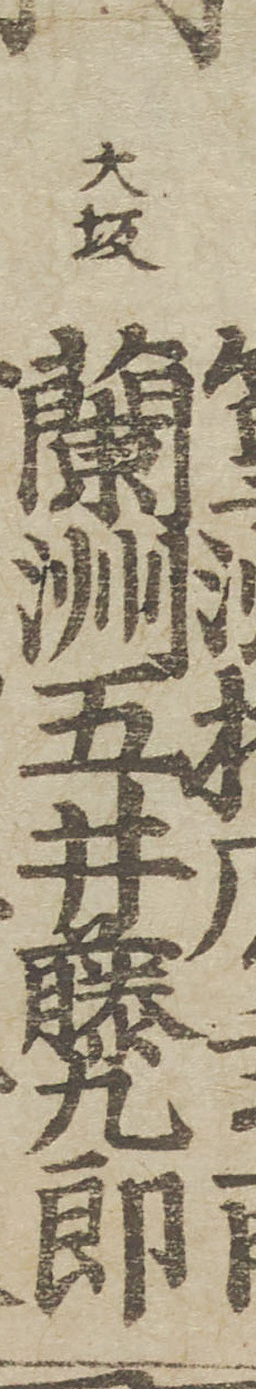同大坂蘭洲五井藤九郎
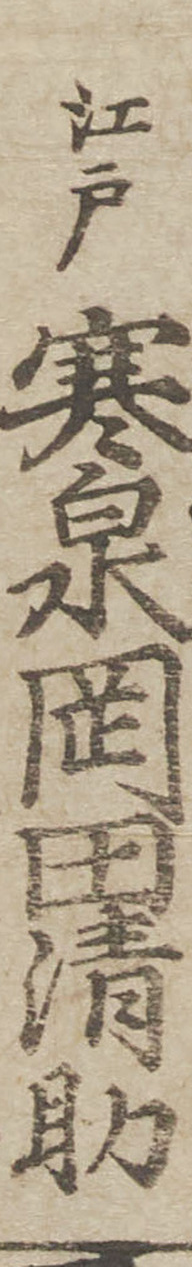同江戸寒泉岡田清助
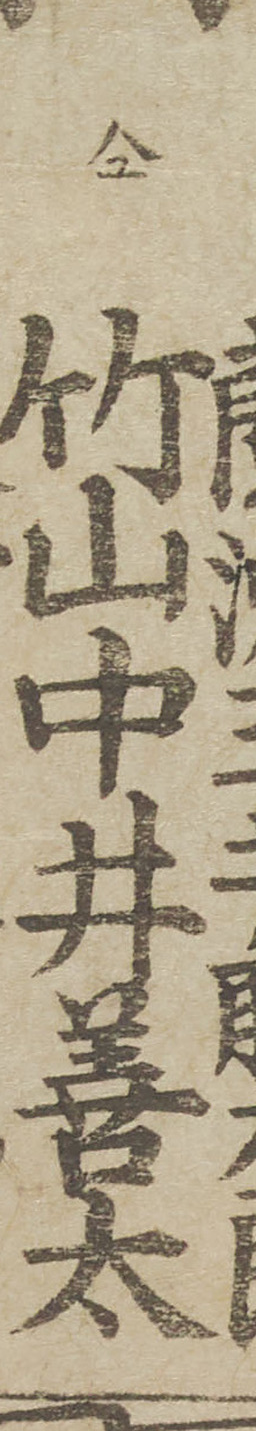同仝竹山中井善太
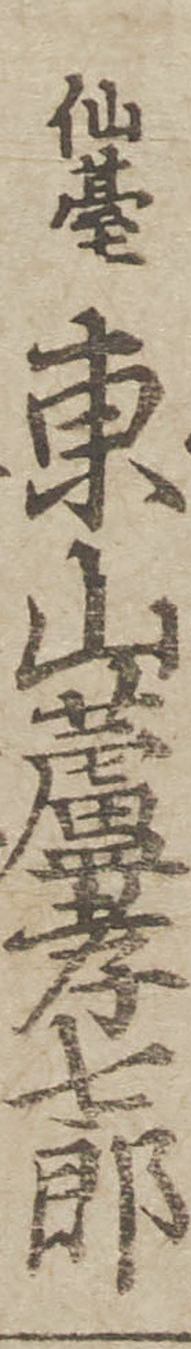同仙臺東山蘆孝七郎
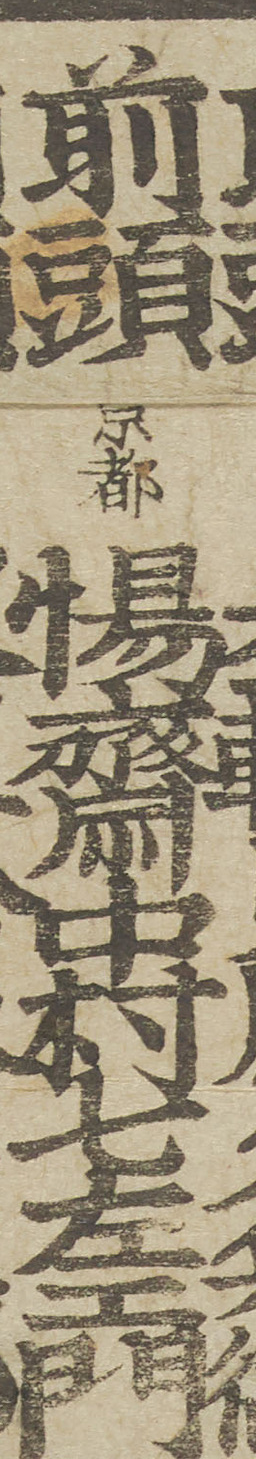前頭京都惕斎中村七左エ門
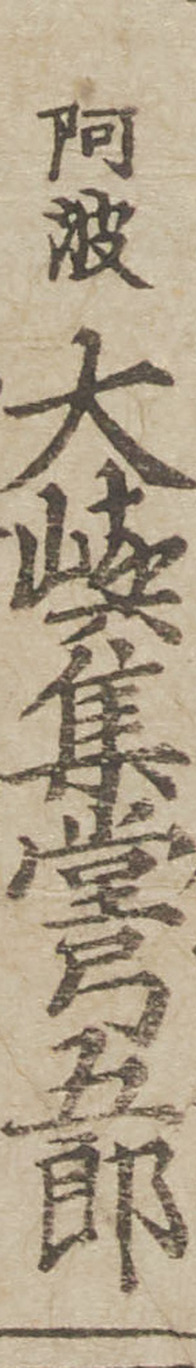同阿波大嶼集堂弓五郎
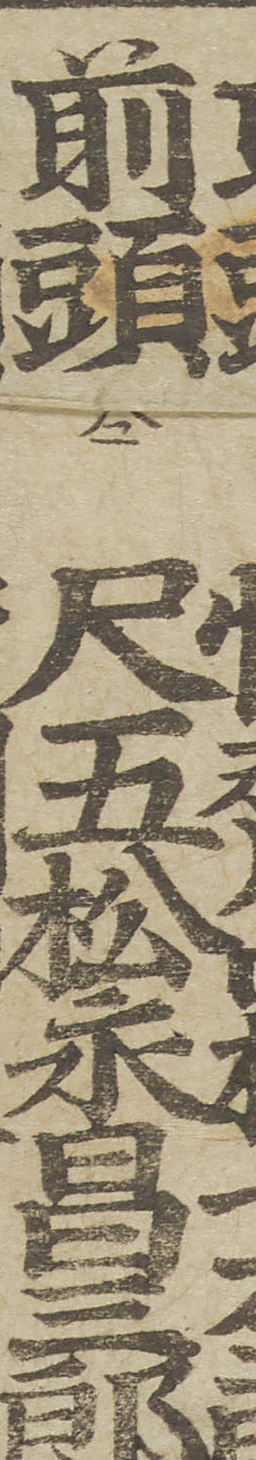前頭仝尺五松永昌三郎
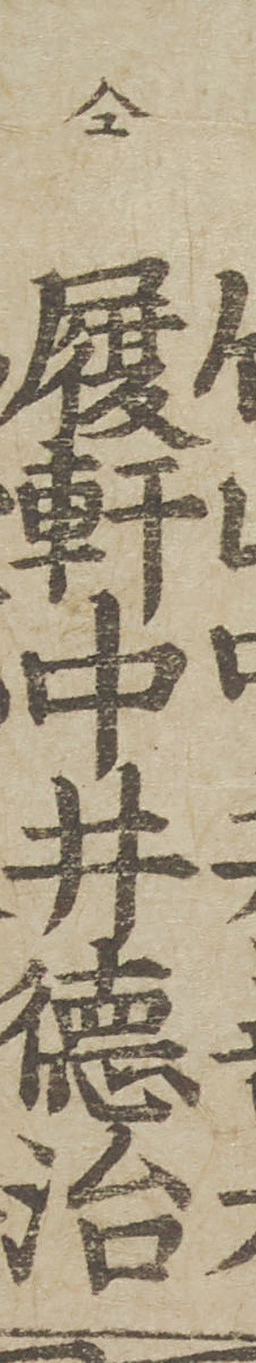同仝履軒中井徳治
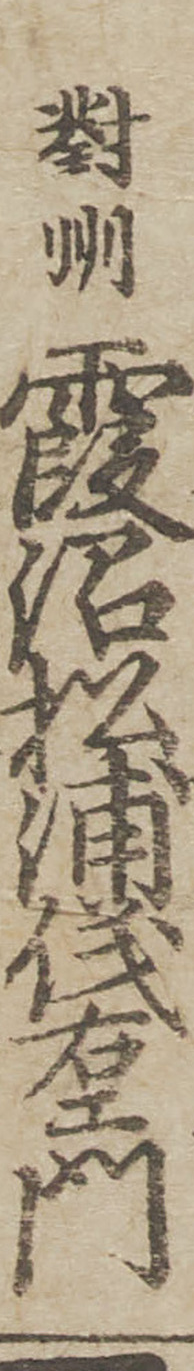同對州霞沼松浦儀右エ門
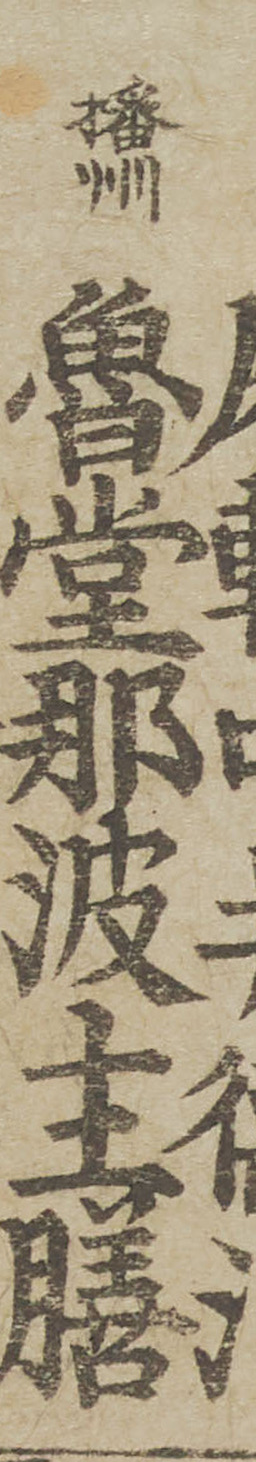同播州魯堂那波主膳
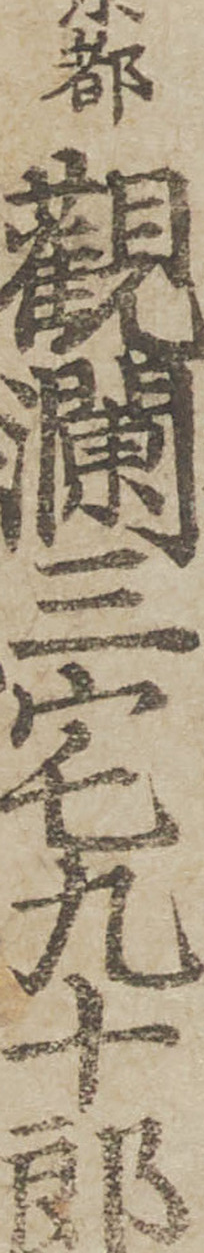同京都観瀾三宅九十郎
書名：儒者競
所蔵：東京大学総合図書館 General Library in the University of Tokyo, JAPAN
